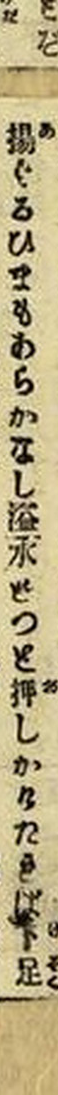揚ぐるひまもあらかなし溢水どつと押しかけたれば下足
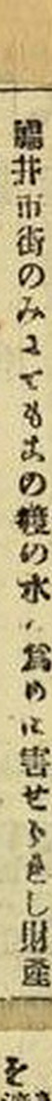福井市街のみにてもこの度の水の為めに害せられし財産
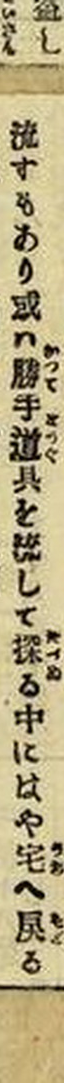流すもあり或は勝手道具を流して探る中にはや宅へ戻る
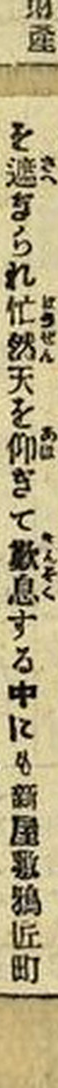を遮ぎられ茫然天を仰ぎて歎息する中にも新屋敷鵜匠町
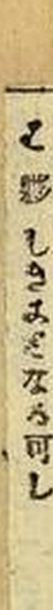は夥しきことなる可し
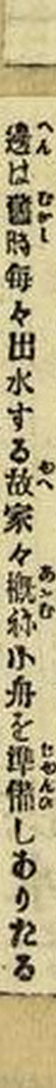辺は旧時毎々出水する故家々概ね小舟を準備しありたる
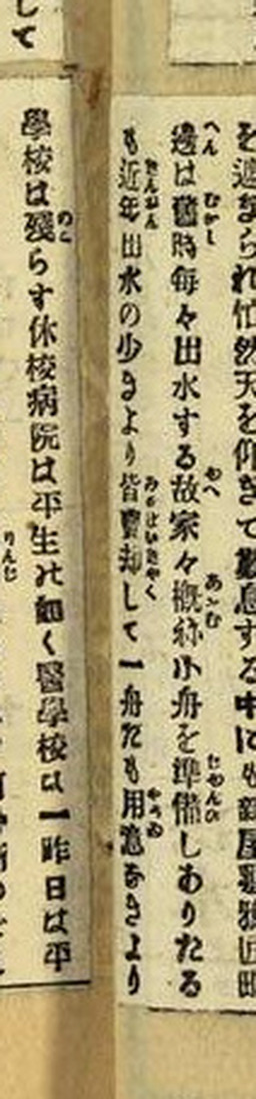も近年出水の少きより皆売却にて一舟だも用意なきより
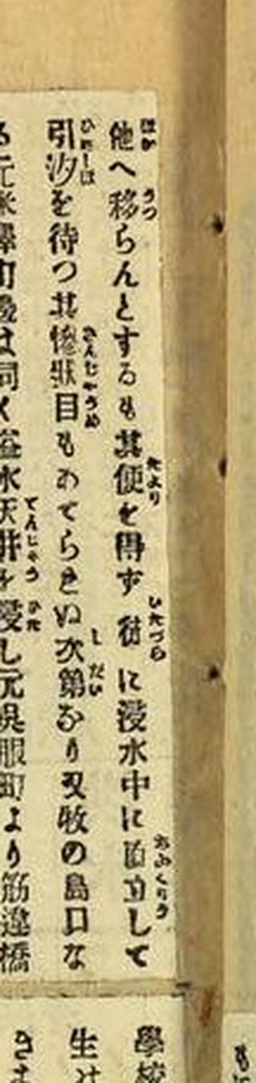他へ移らんとするも其便を得ず徒に浸水中に直立して
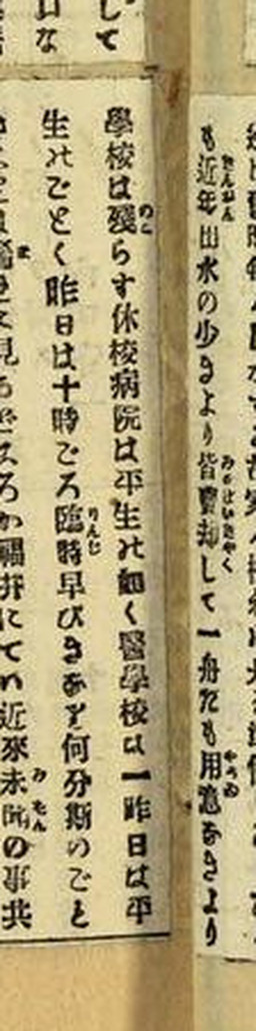学校は残らず休校病院は平生の如く医学校は一昨日は平
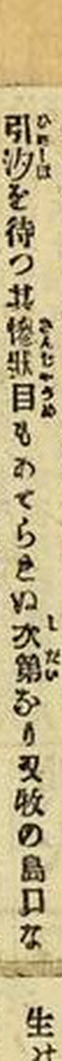引汐を待つ其惨状目もあてられぬ次第なり又牧の島口な
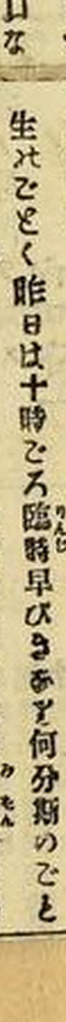生のごとく昨日は十時ごろ臨時早引びきなど何分斯のごと
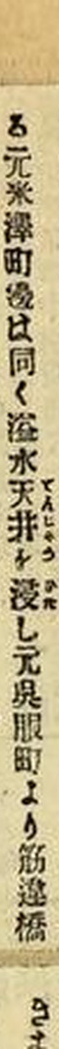る元米沢町辺は同く溢水天井を浸し元呉服町より筋違橋
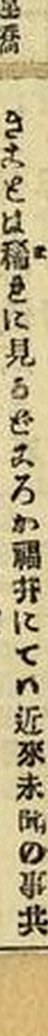きことは稀れに見るどころか福井にては近来未聞の事共
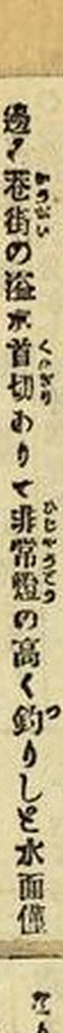辺は巷街の溢水首切ありて非常燈の高く釣りしと水面僅
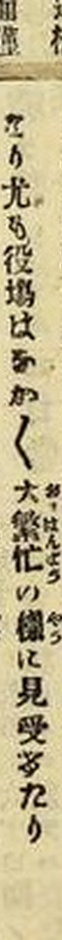なり尤役場はなか〳〵大繁昌の様に見受けたり
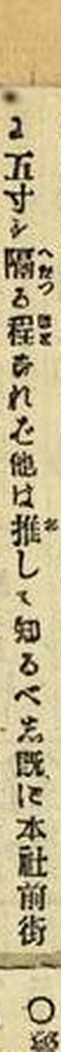に五寸を隔る程なれば他は推して知るべし既に本社前街
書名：温古集 五巻
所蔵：福井県文書館 Fukui Prefectural Archives
